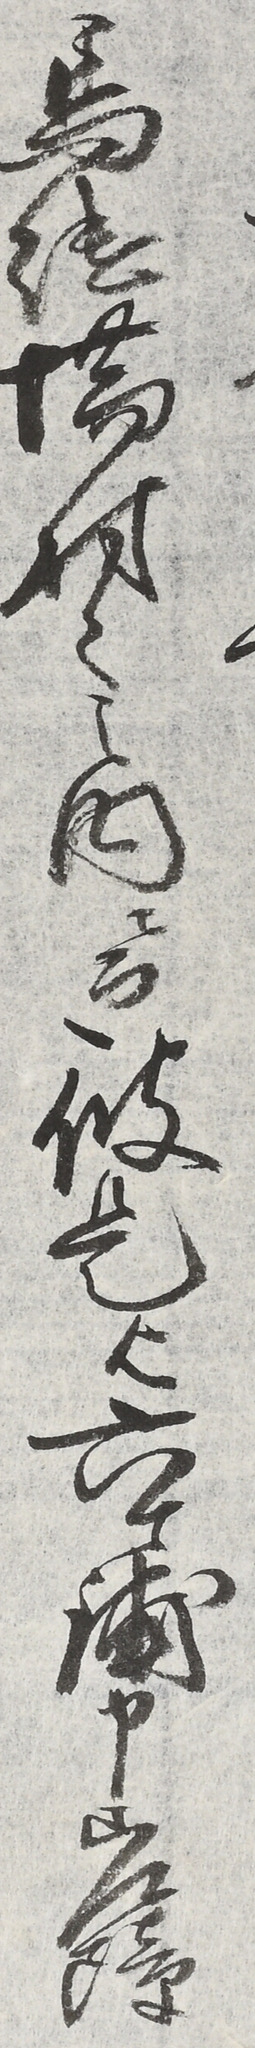馬継場村々之内ニ而彼是と六ヶ敷申差障
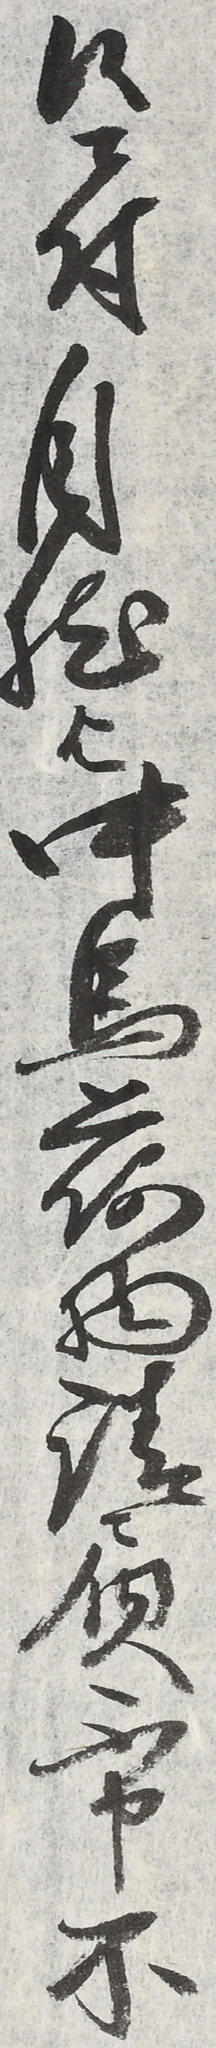候ニ付自然と中馬荷物請負不申不
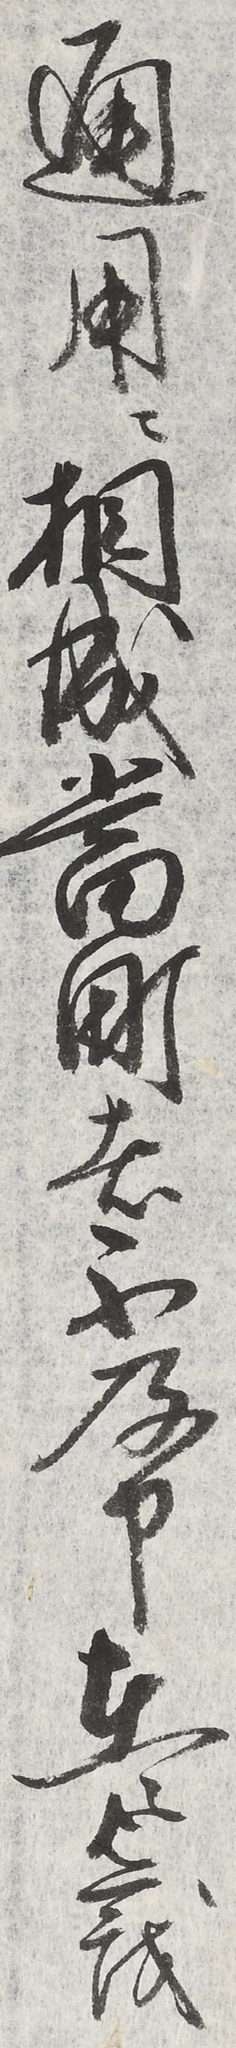通用ニ相成当町は不及申在々迄も
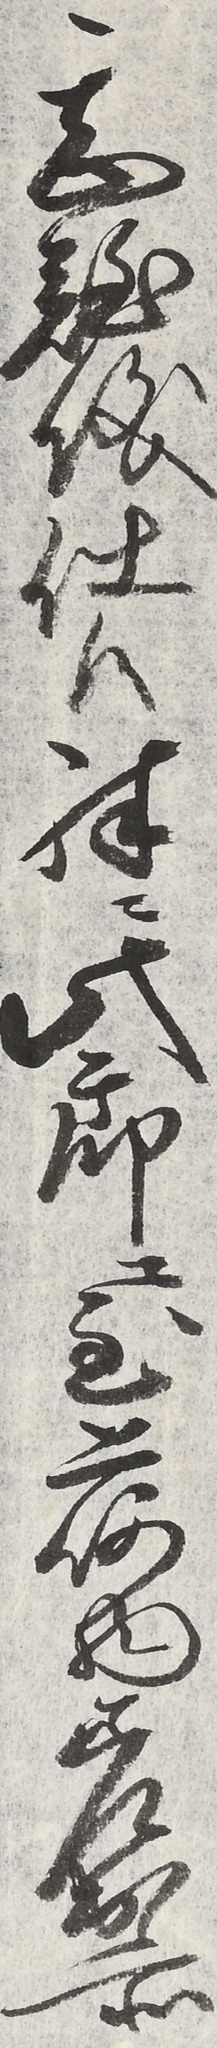甚難儀仕候殊ニ此節ニ至荷物差出候所
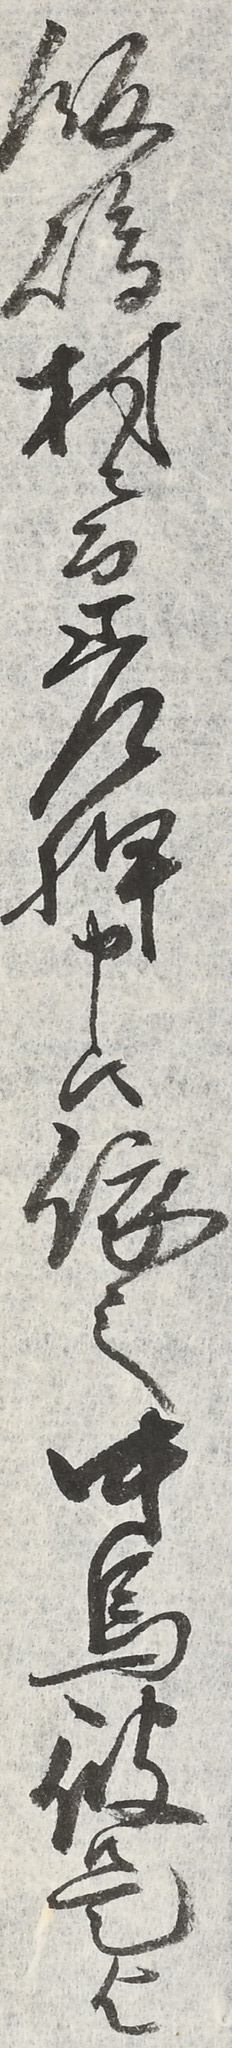飯嶋村ニ而差押申候依之中馬彼是と
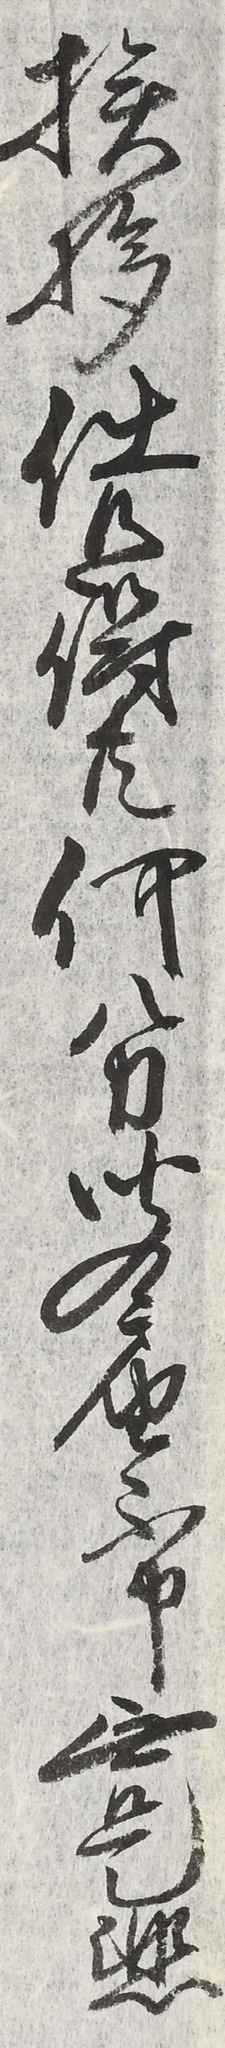挨拶仕候得共何分聞届不申無是悲
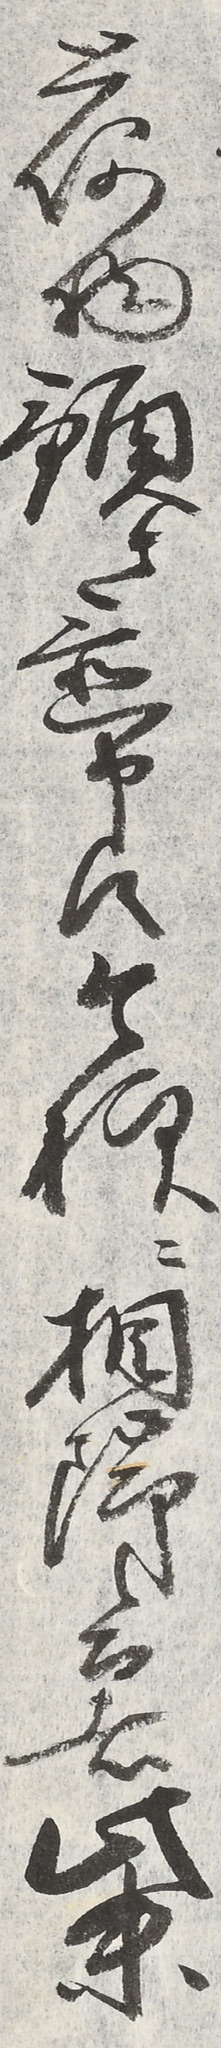荷物預ヶ置申候ヶ様ニ相滞候而は此未
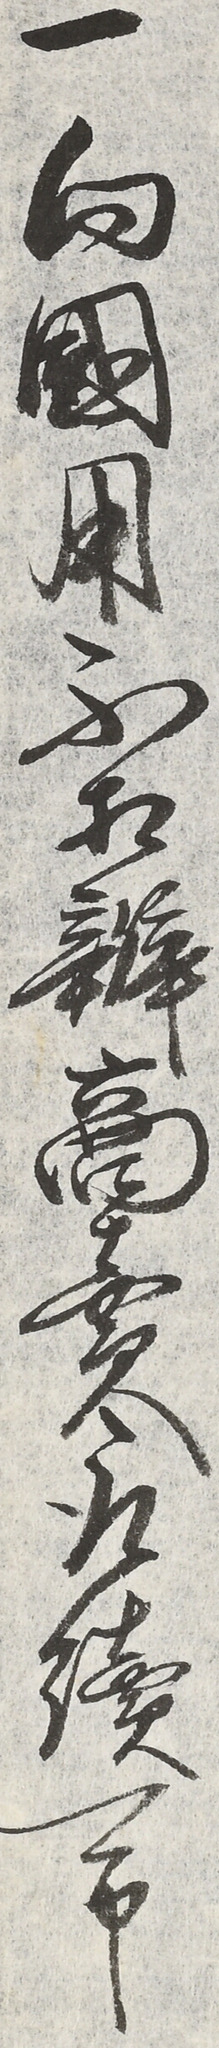一向国用不相弁商売取続可申
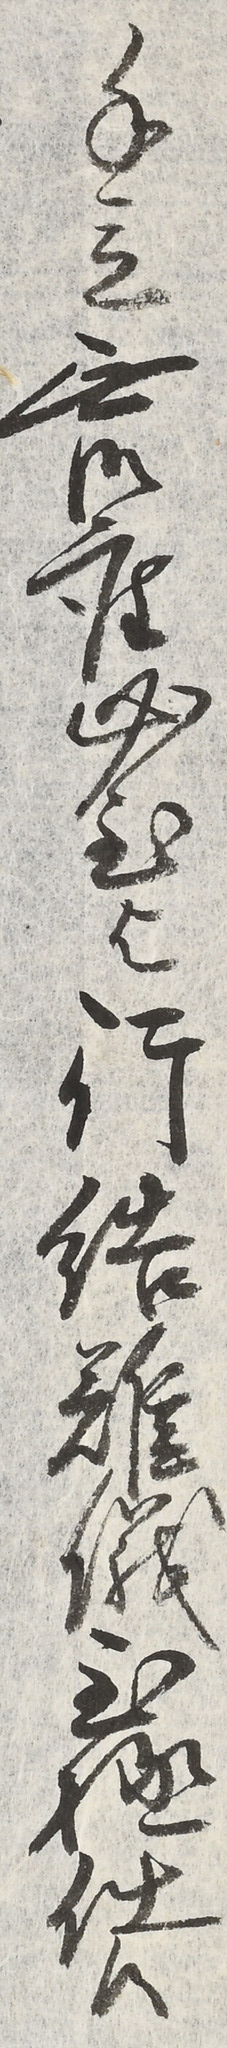手立無御座必至と行詰難儀至極仕候
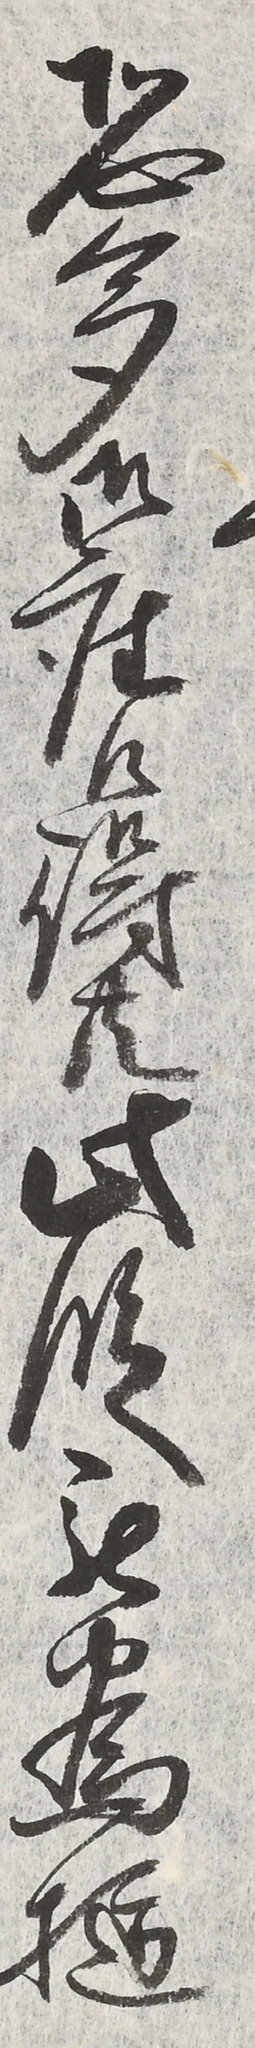恐多御座候得共此段被為遊
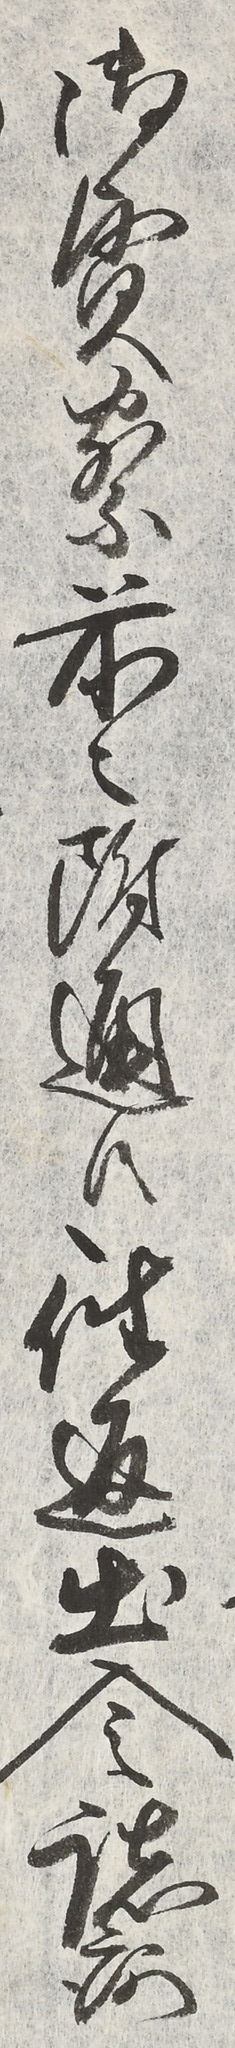御賢察前々附通候往返出入之諸荷
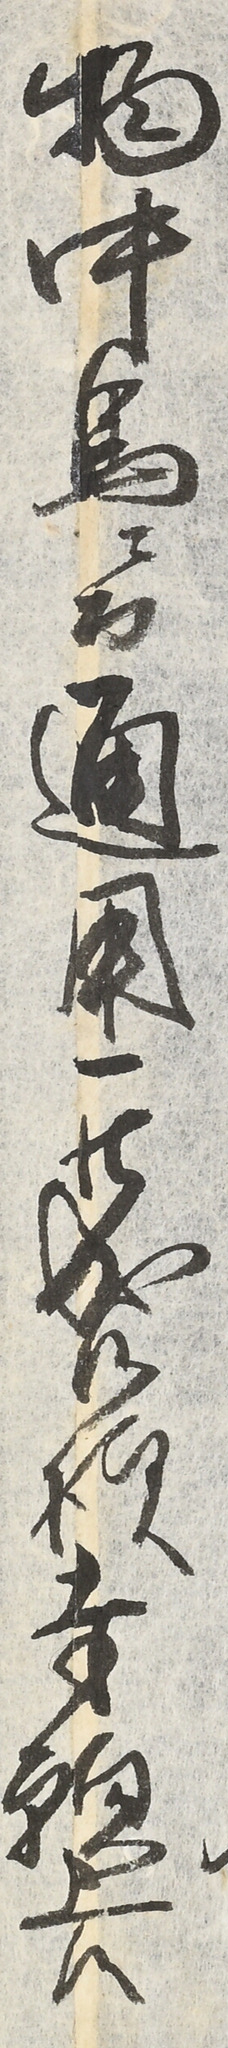物中馬ニ而通用被成候様奉願上候
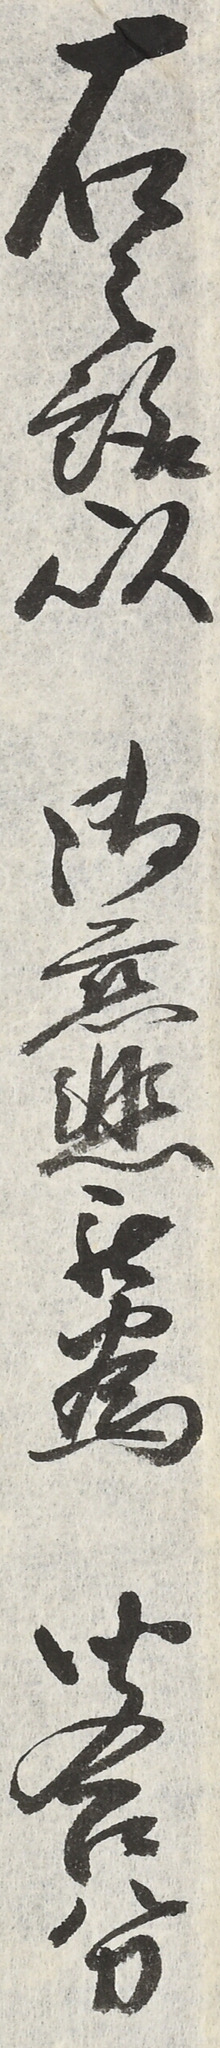右之趣以御慈悲被為聞召分
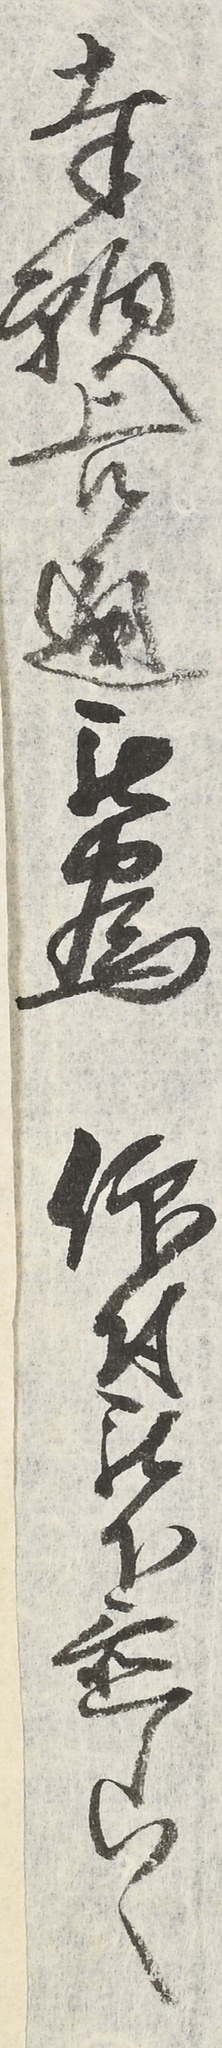奉願上候通被為仰付被下置候ハヽ

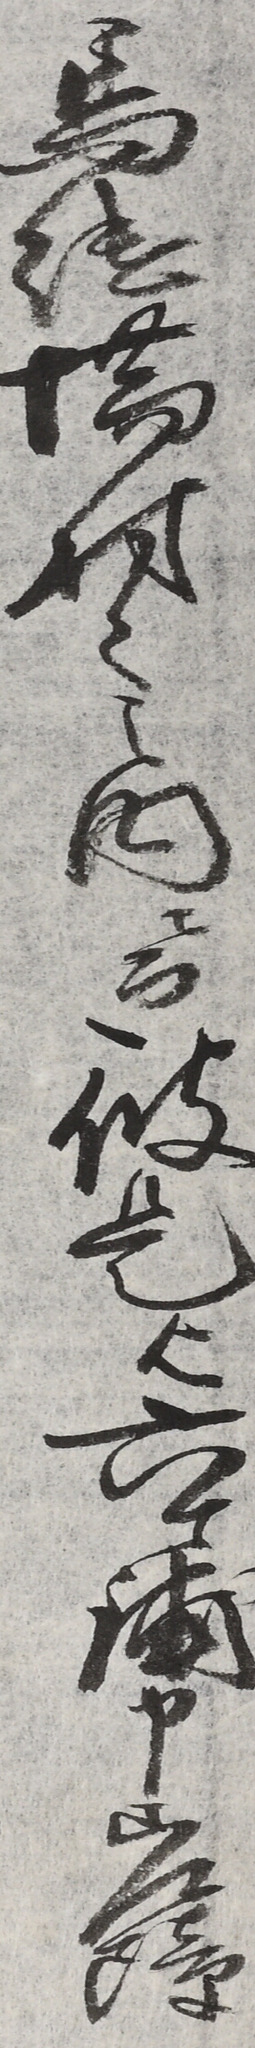馬継場村々之内ニ而彼是と六ヶ敷申差障
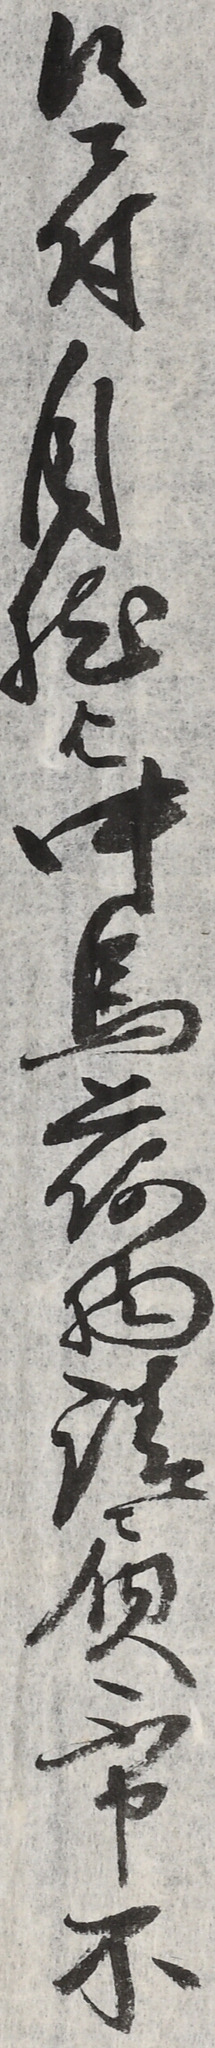候ニ付自然と中馬荷物請負不申不
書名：乍恐以書付御訴訟申上候御事
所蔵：伊那市立高遠町図書館・合同会社AMANE
